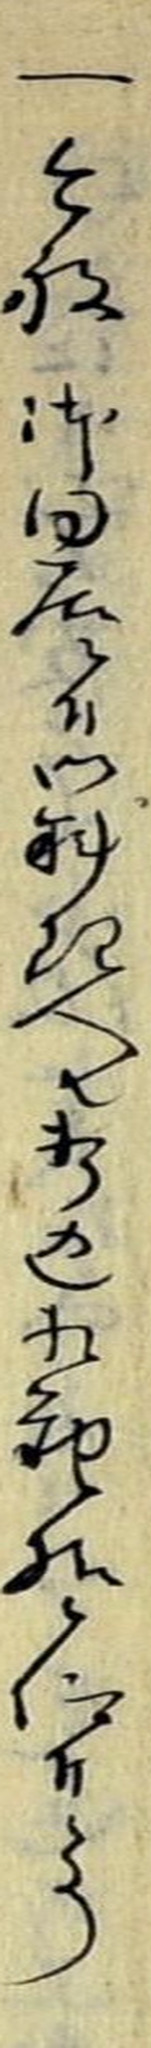一今般御同居ニ付御料理人共打込相勤候様被仰付候事
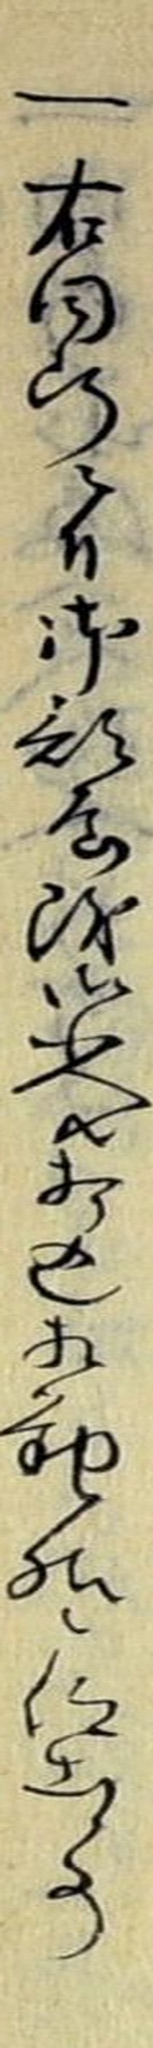一右同断ニ付御部屋付御小人共打込相勤候様被仰出候事
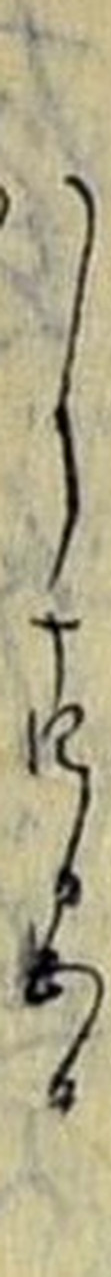八月十四日五日
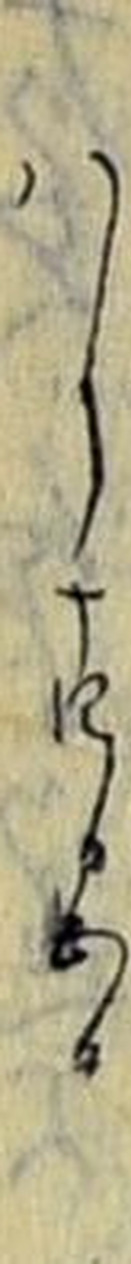八月十四日五日
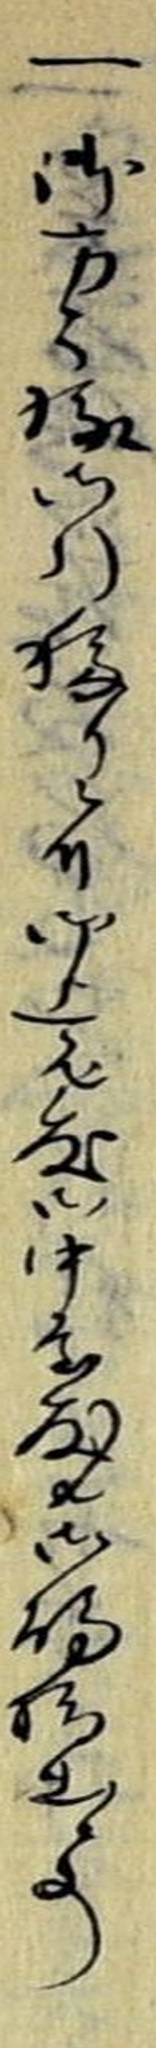一御方々様御引移りニ付御上屋敷御中屋敷共御触指出候事
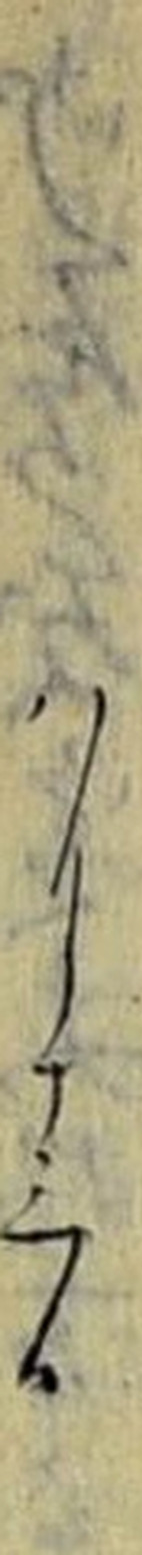八月十三日
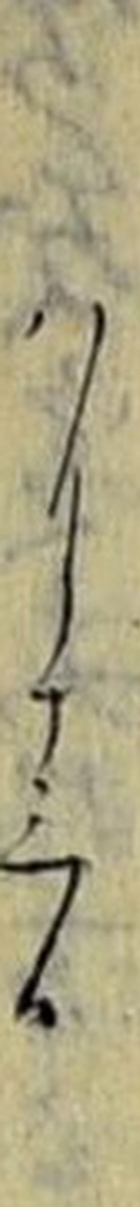八月十三日
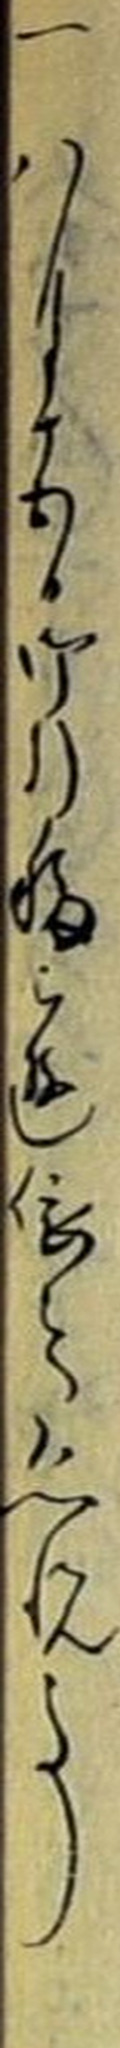一八月十五日御引移被遊依之恐悦候事
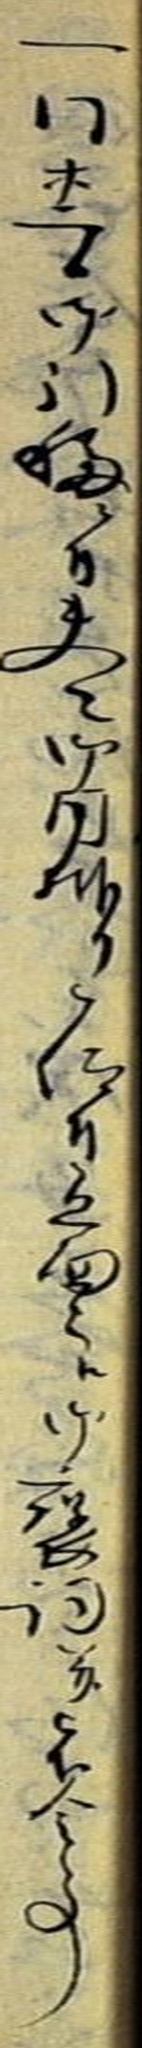一同廿二日御引移ニ付夫々御用掛り被仰付置面々江御褒詞并被下金候事
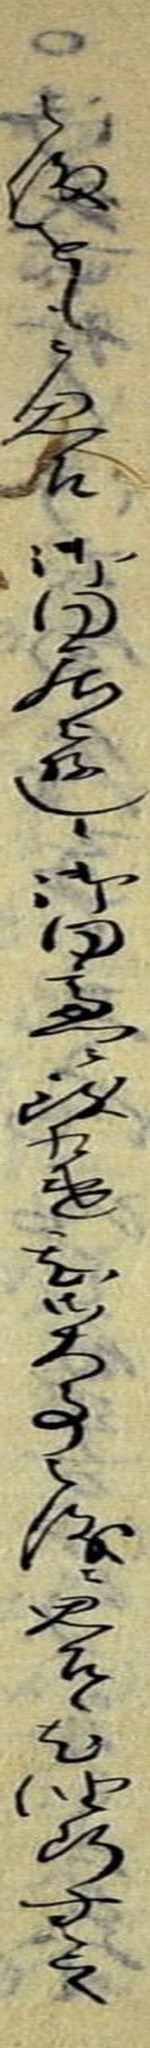之儀をも被思召御同居被遊候御同慮ニ致相違甚御大事之儀ニ思召候尤油断無之
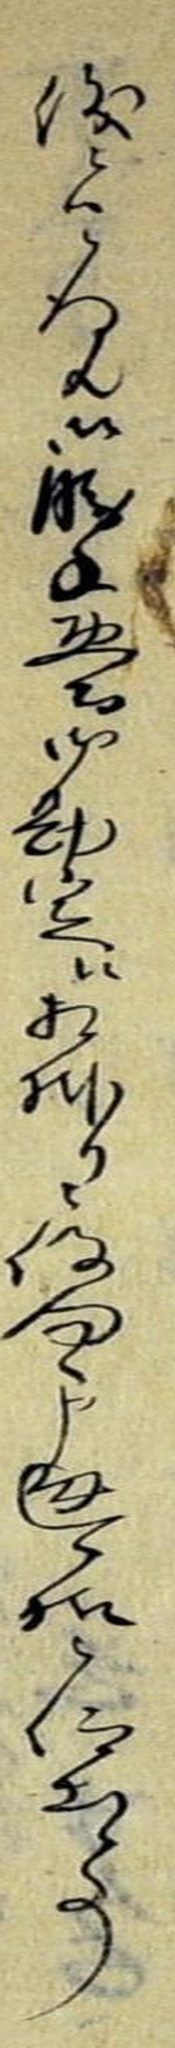儀ニハ候得共御勝手惣而御勘定江相掛り候役向へ申通候様被仰出候事
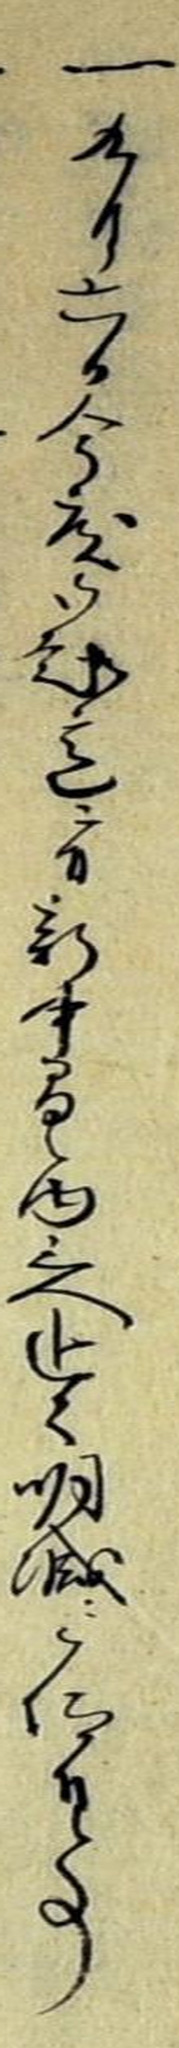一九月六日今度御趣意ニ付新中間之内三人追々明減ニ被仰付候事
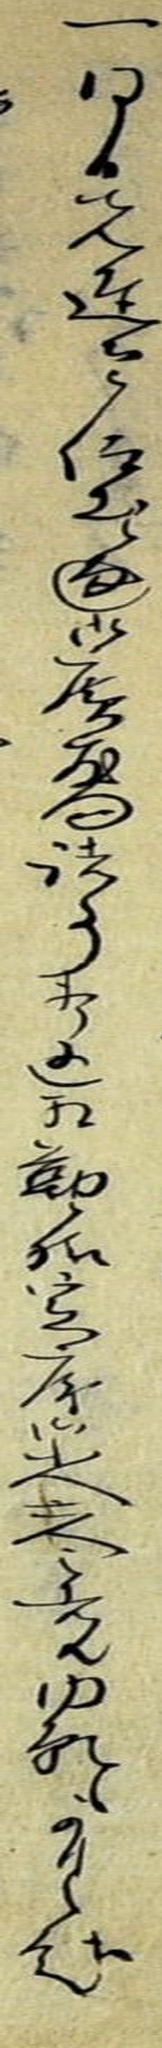一同日先達而被仰出候通御広敷向諸事打込相勤候様定席御小人六人之者共内願も有之趣
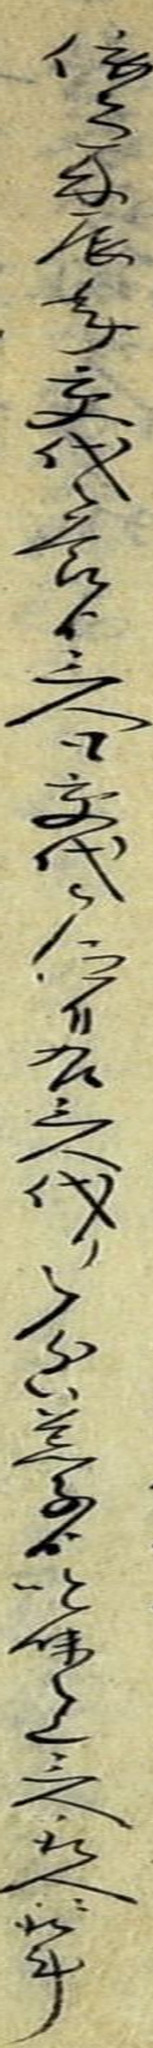依之来辰年交代之節ゟ三人ツヽ交代被仰付右三人代り之分ハ荒子ゟ吟味之上三人取人ニ取計
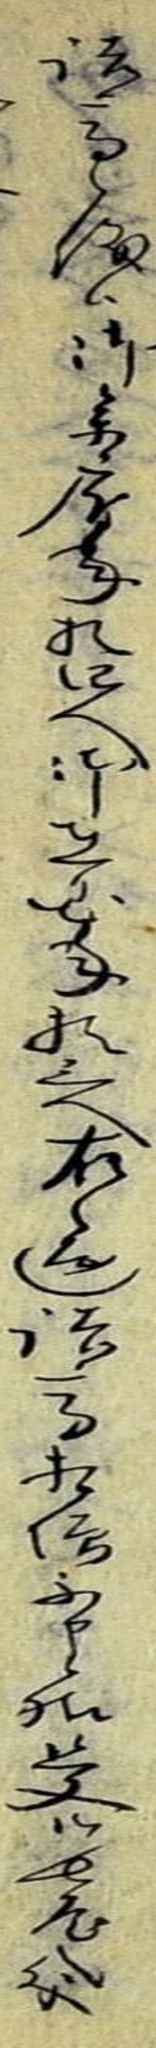諸高之儀ハ御参府年拾四人御在国年拾三人右之通諸高相増不申候様且又御長屋之義
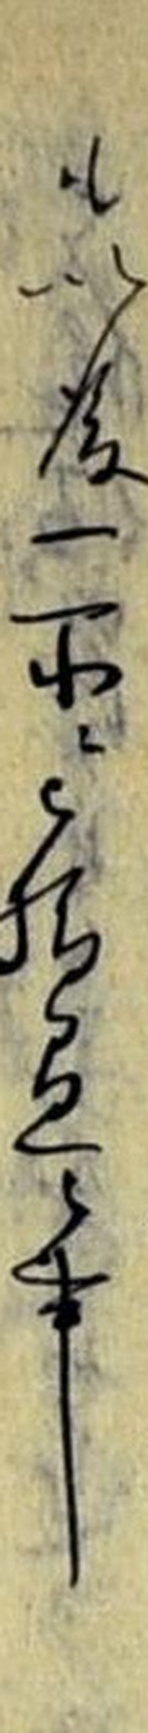も以後一所ニ被指置候事
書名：命令之部 三
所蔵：福井県文書館 Fukui Prefectural Archives
